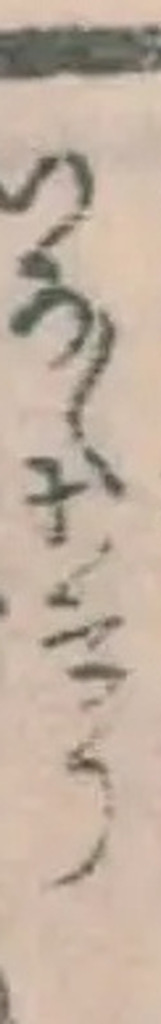いろ〳〵ちそう
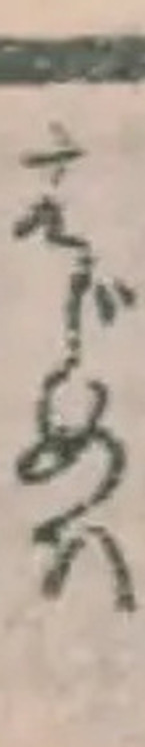はじめは
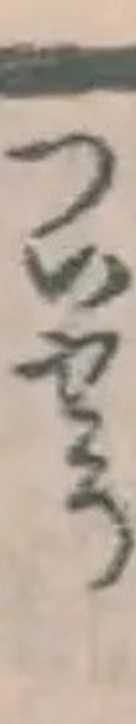ついせう
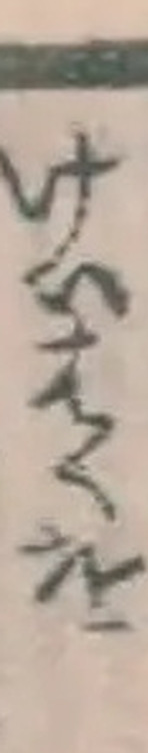けいはくを
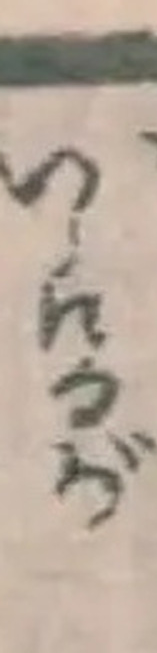いゝけるが
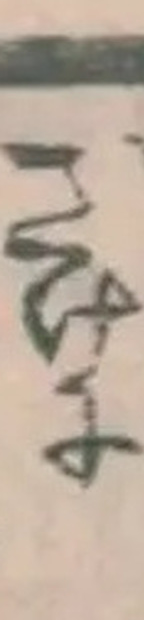さけに
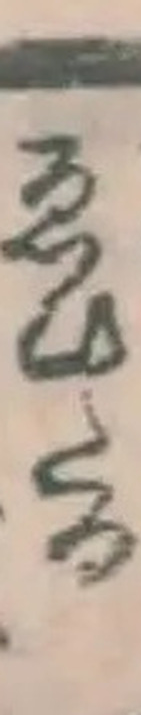ゑひたる
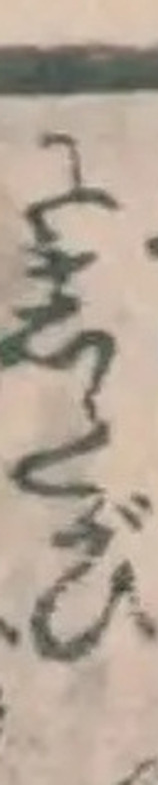にしたがひ
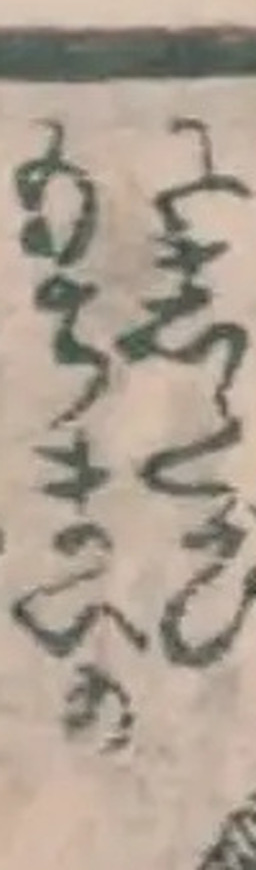もちまいの
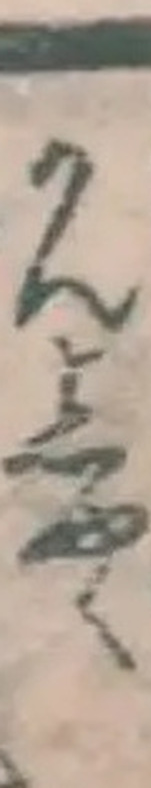かんしやく
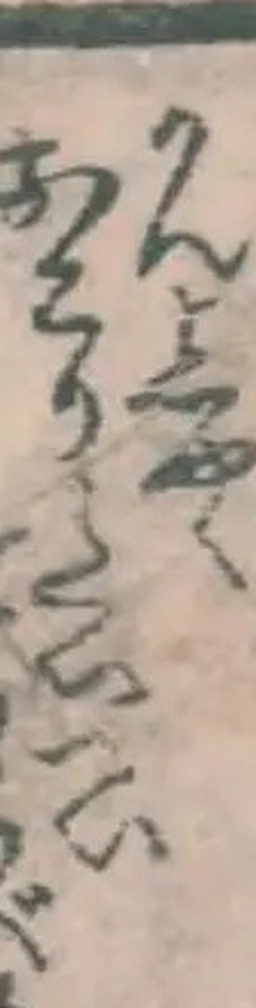おこりたいへい
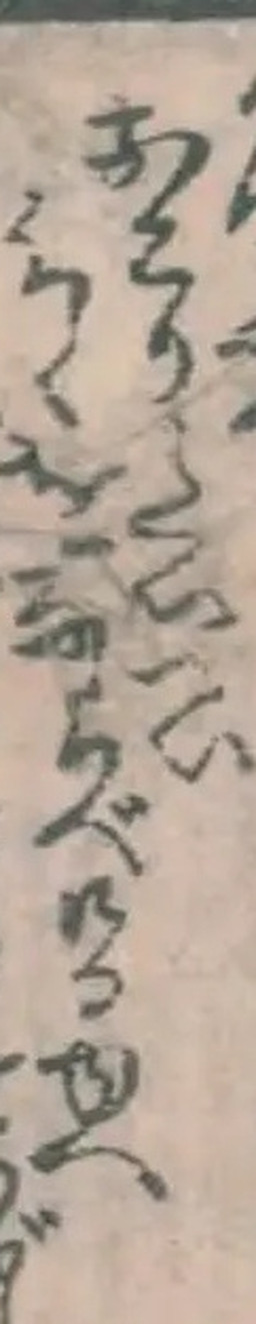らくほならべけるゆへ
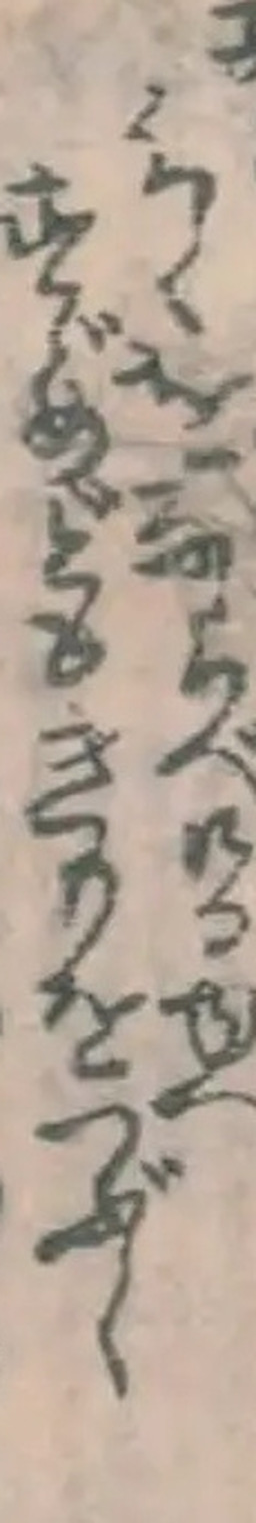すゞめどもきもをつぶし
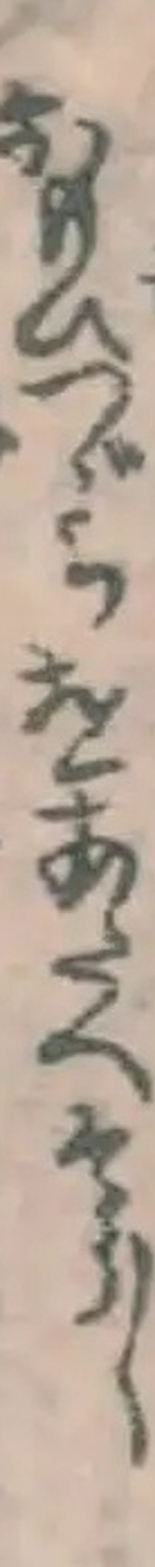おもひつゞらをあたへそう〳〵
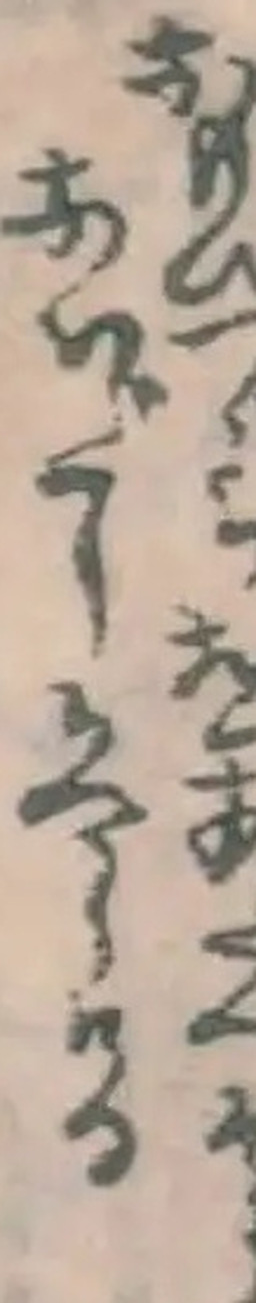おいだしかへしける
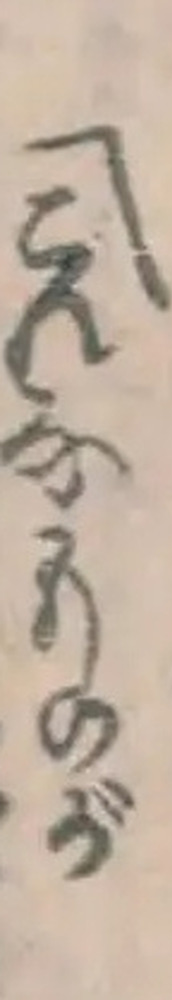〽こんなものが
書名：舌切雀
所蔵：国立国会図書館 National Diet Library, JAPAN
